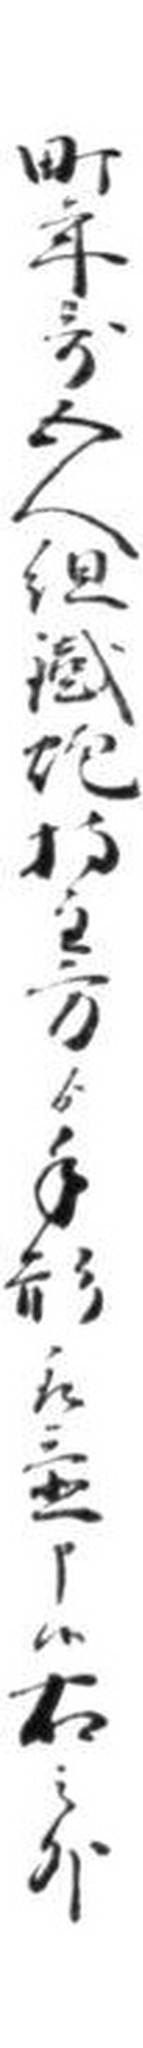町年寄五人組鉄炮持主方ゟ手形取置申候右之外
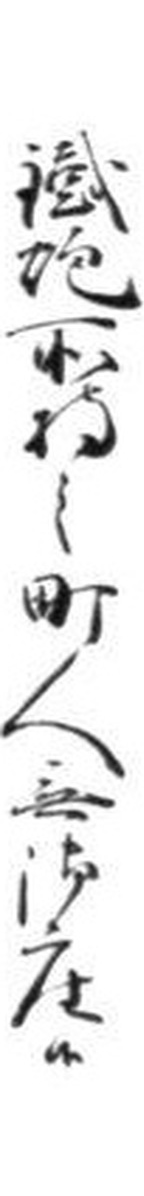鉄炮所持之町人無御座候
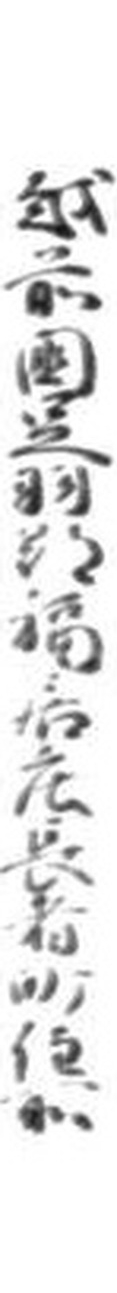越前国足羽郡福居庄長者町住所
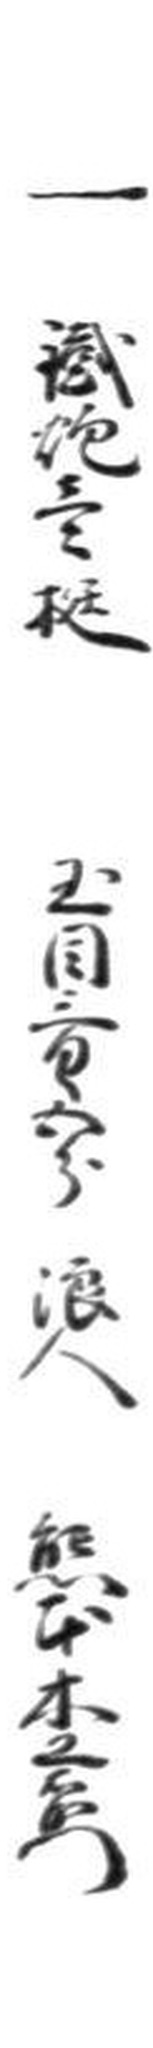一鉄炮壱挺玉目三匁五分浪人熊本木工右衛門
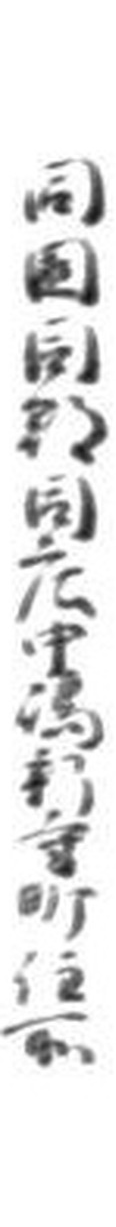同国同郡同庄中嶋新寺町住所
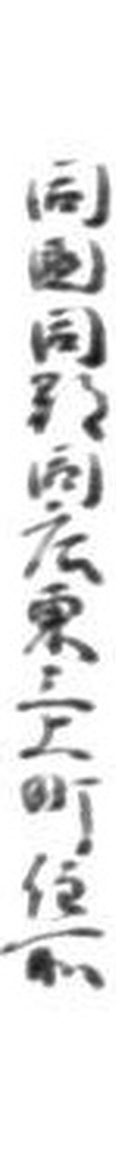同国同郡同庄東三上町住所
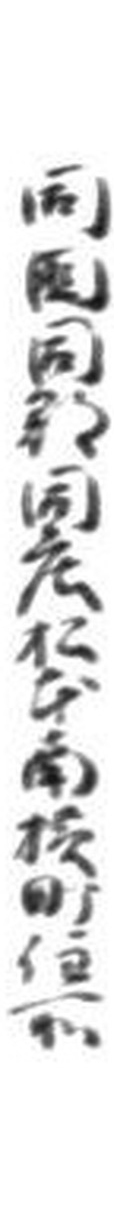同国同郡同庄松本南横町住所

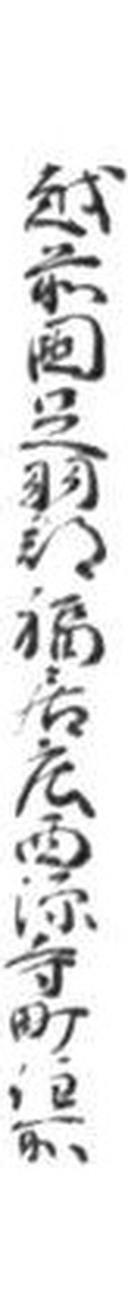越前国足羽郡福居庄西源寺町住所
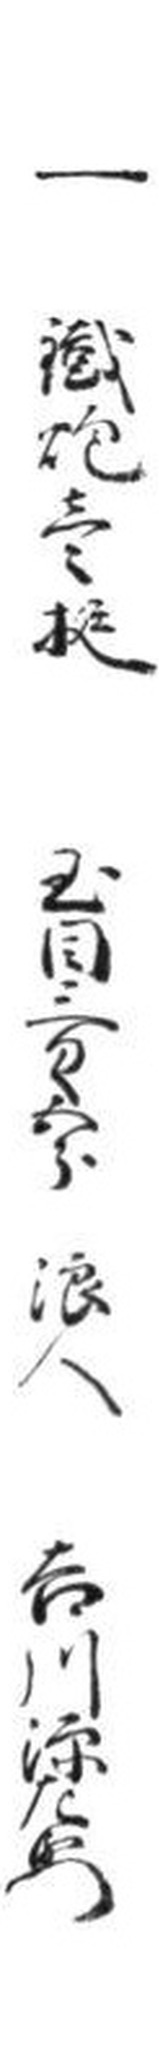一鉄炮壱挺玉目三匁五分浪人吉川源左衛門
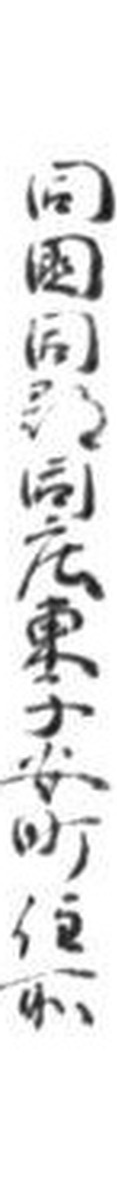同国同郡同庄東子安町住所
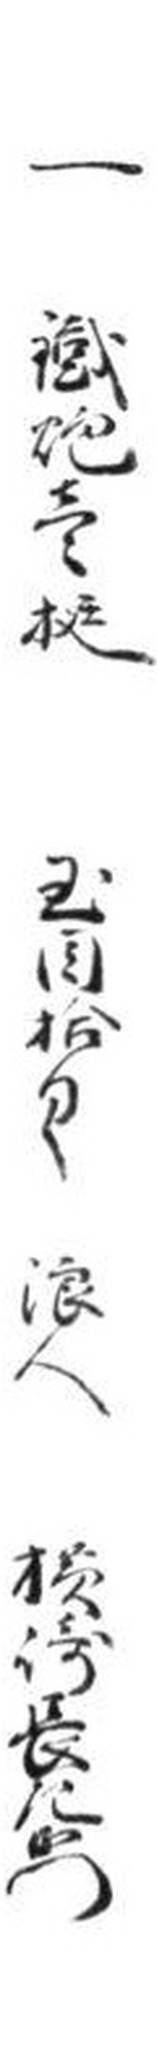一鉄炮壱挺玉目拾匁浪人横崎長左衛門
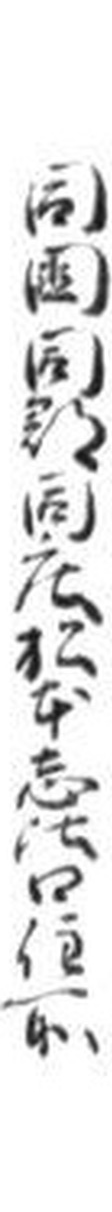同国同郡同庄松本志比口住所
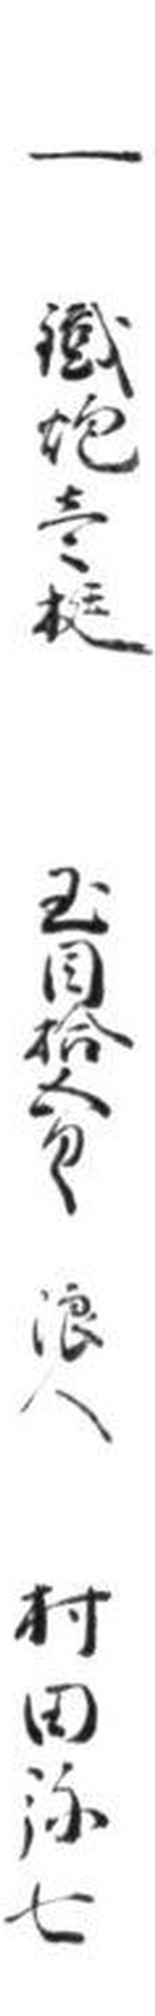一鉄炮壱挺玉目拾五匁浪人村田弥七
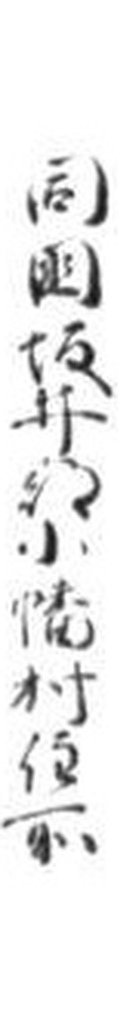同国坂井郡小幡村住所
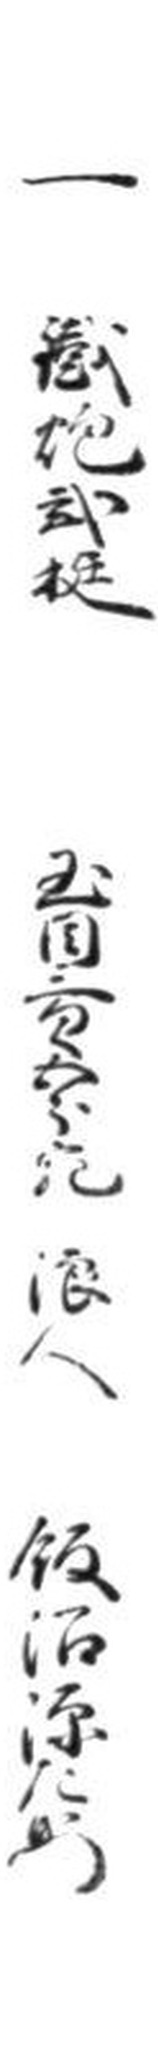一鉄炮弐挺玉目三匁五分宛浪人飯沼源左衛門
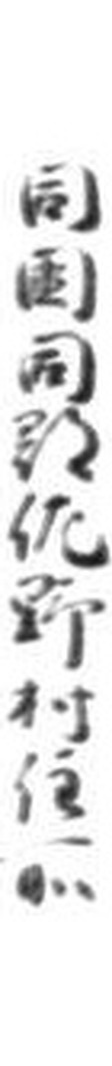同国同郡佐野村住所
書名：家譜 十七 吉品公 従元禄元年到同二年
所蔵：福井県文書館 Fukui Prefectural Archives
